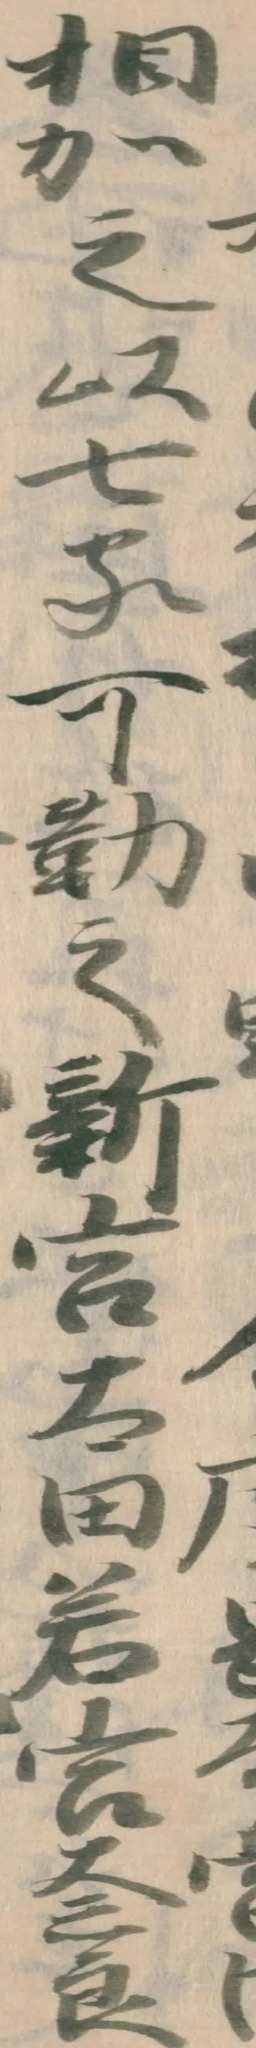相加之以七家可勤之新宮太田若宮奈良
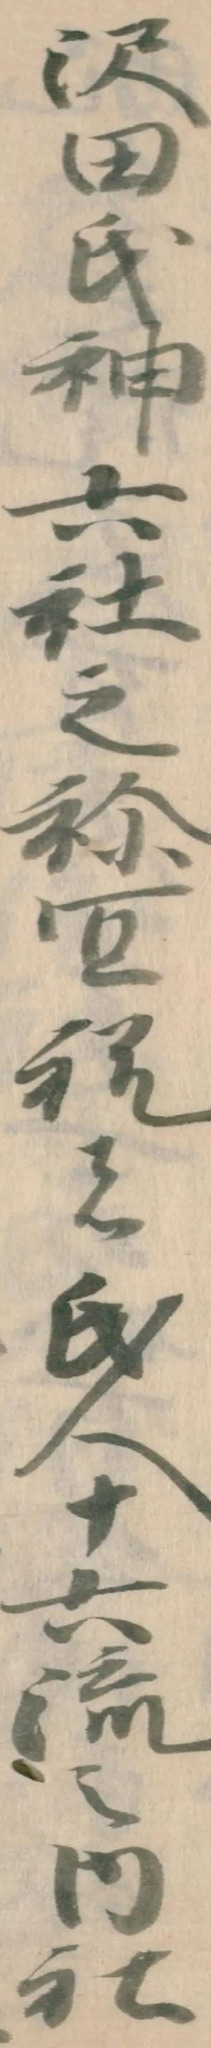沢田氏神六社之称宜祝は氏人十六流之内社
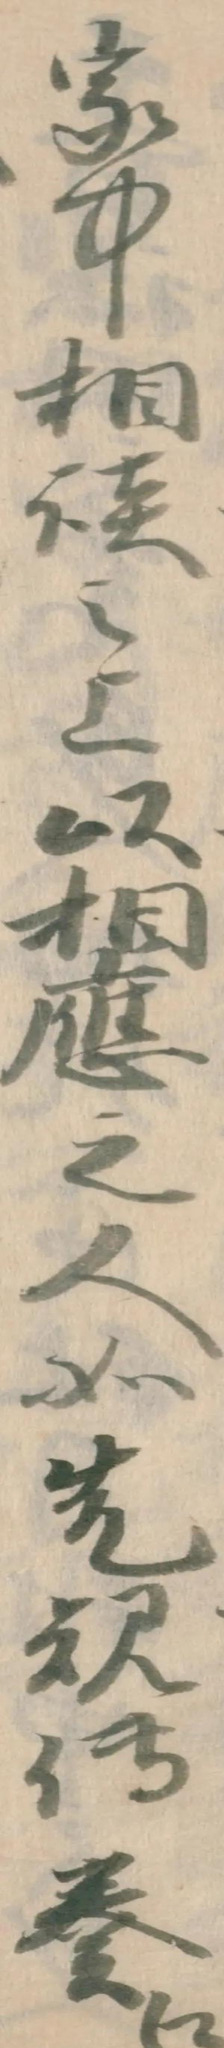家中相談之上以相応之人如先規伝奏え
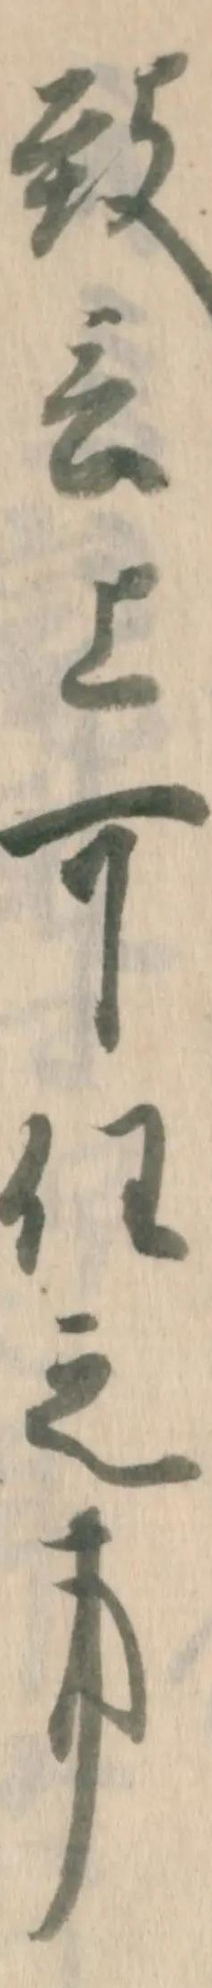致言上可任之事
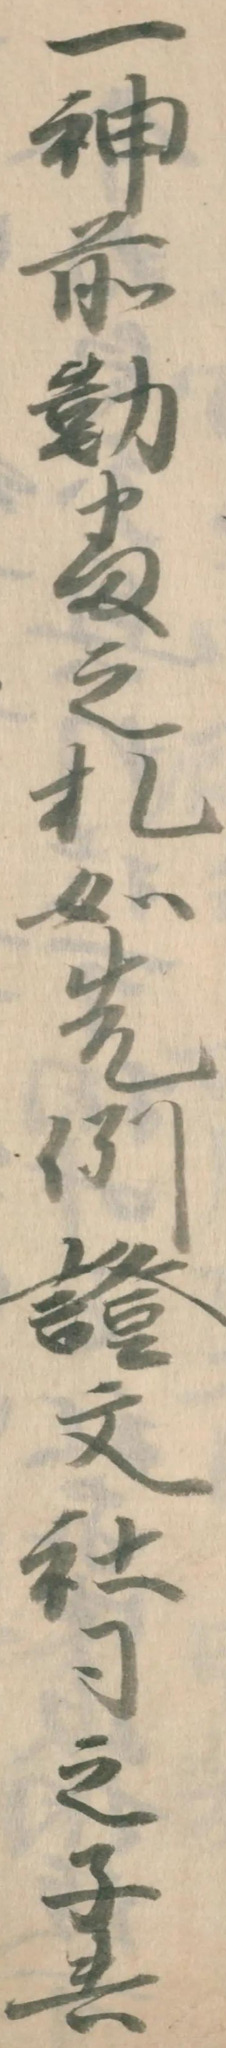一神前勤番之札如先例證文社司之子共
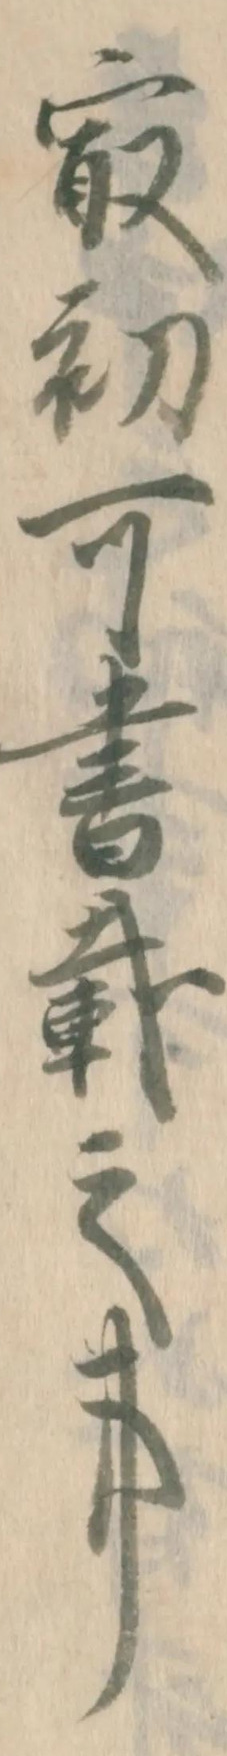最初可書載之事

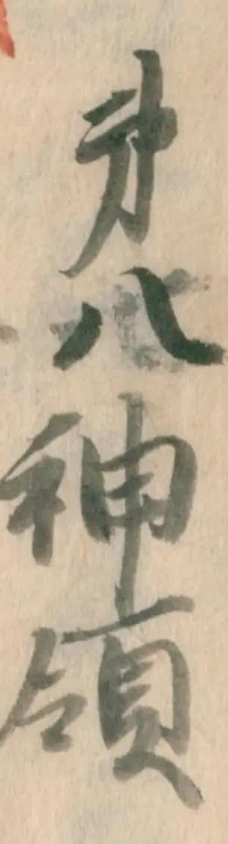第八神領
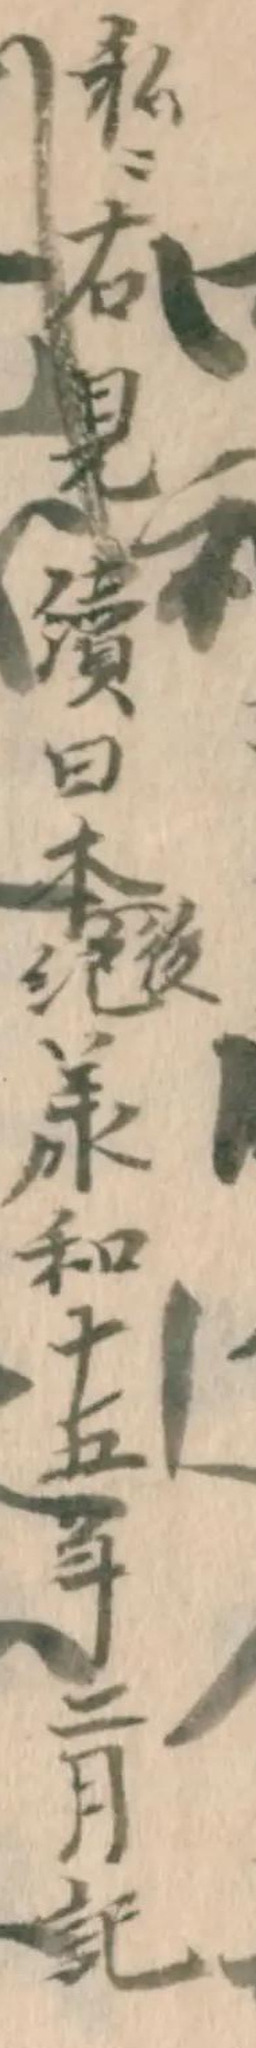私右見続日本◦紀承和十五年二月記
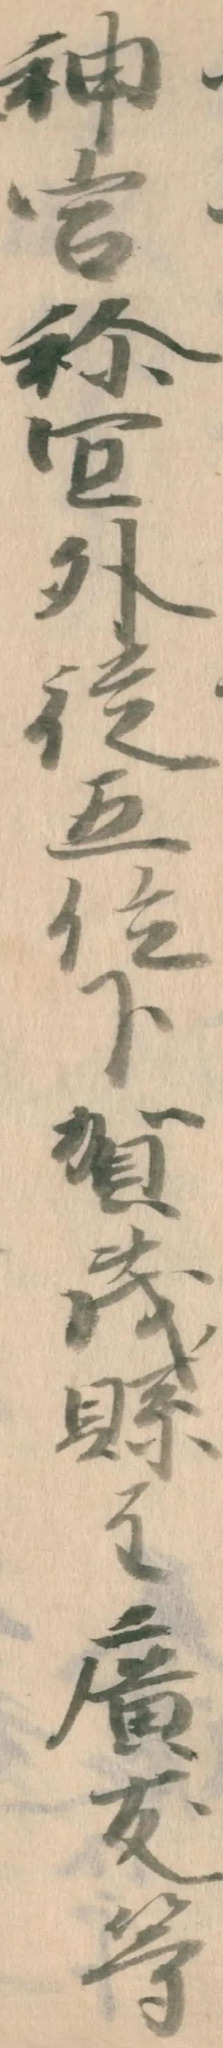神宮称宜外従五位下賀茂県主広友等
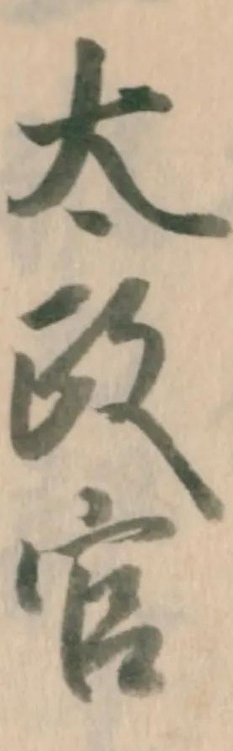太政官
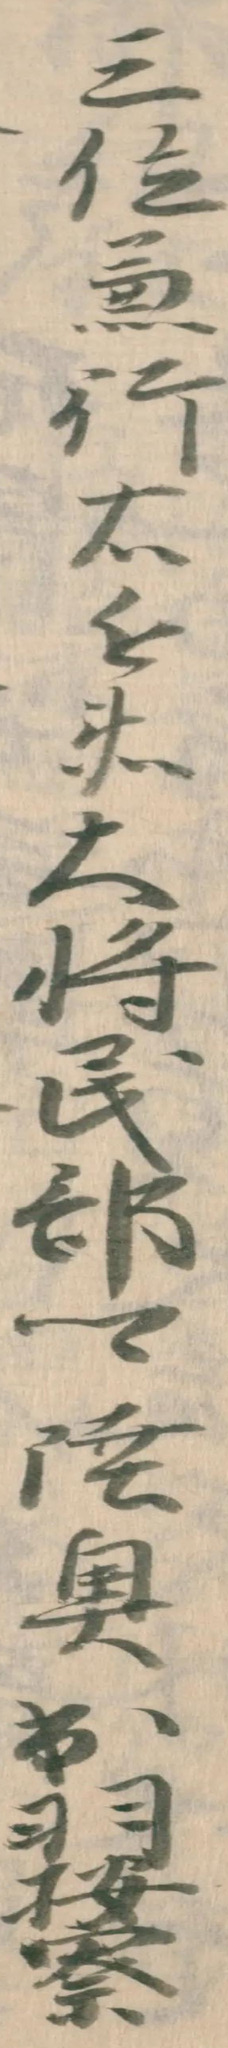三位兼行右近衛大将民部卿陸奥出羽按察
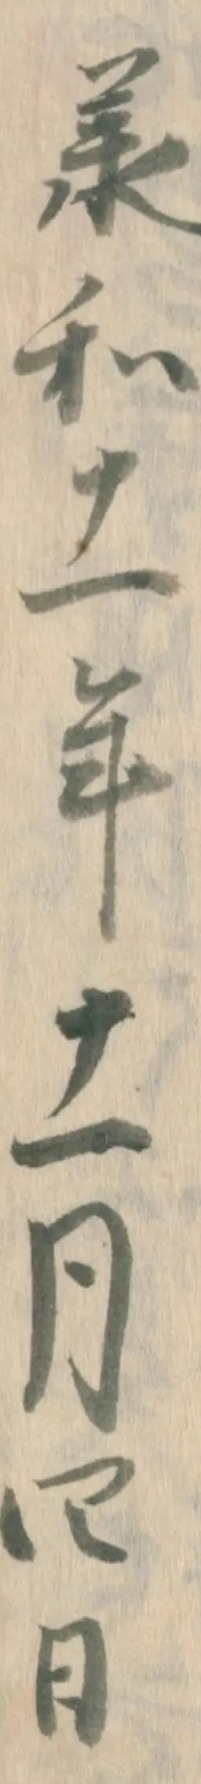承和十一年十一月四日

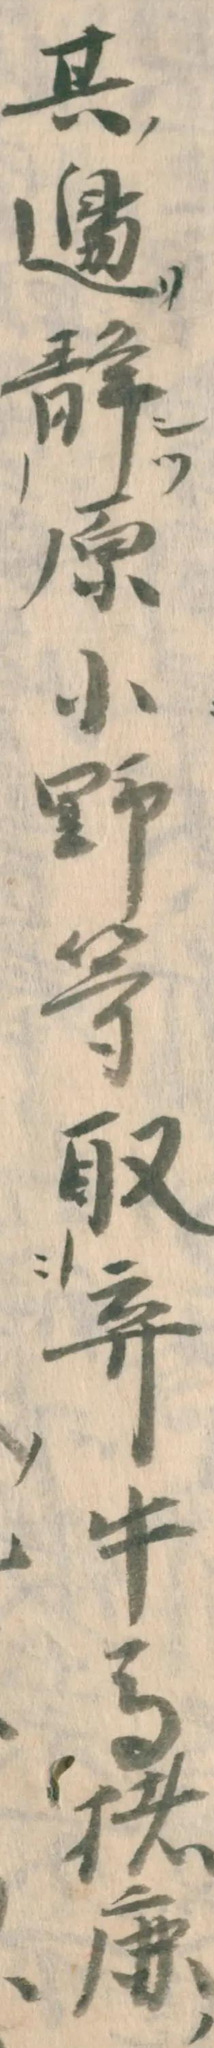其辺静-原小野等取-棄牛馬猪鹿
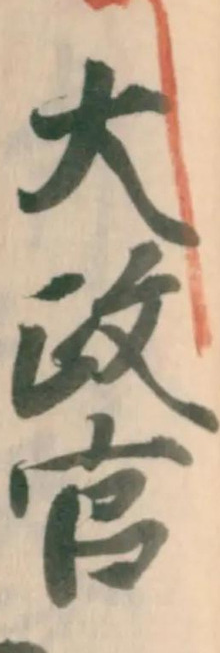大政官

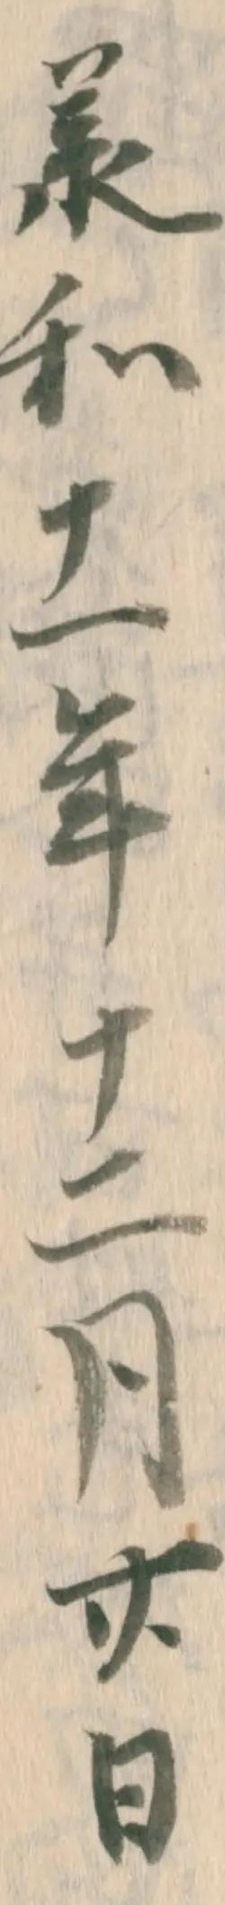承和十一年十二月廿日
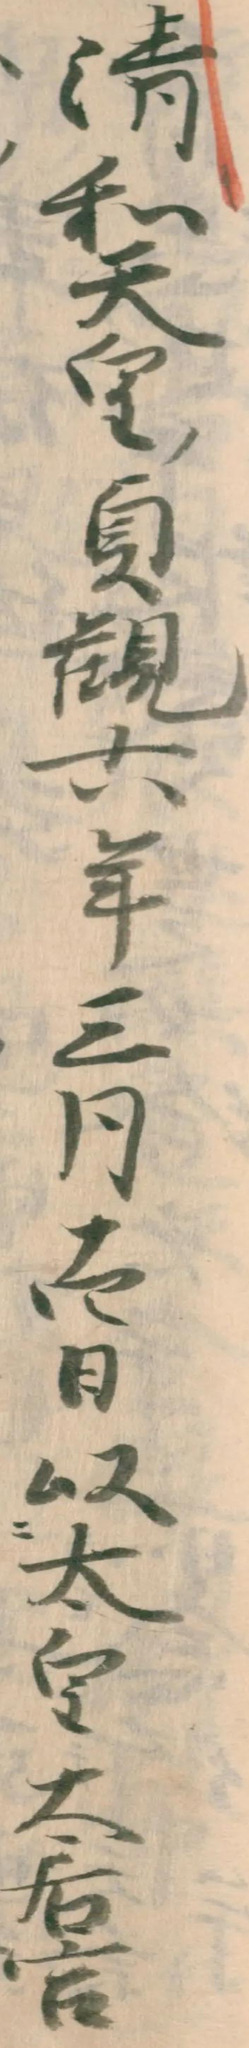清和天皇貞観六年三月十四日以太皇太后宮
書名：賀茂社記録. 第1冊
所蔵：国立国会図書館 National Diet Library, JAPAN
